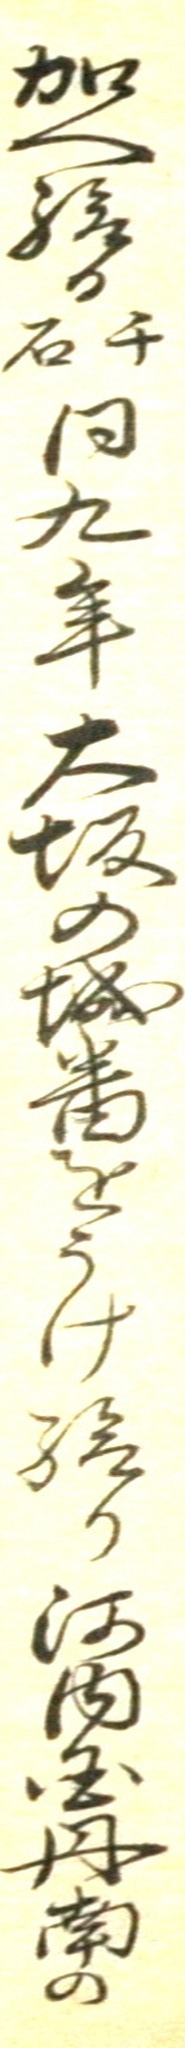加へ給る千石同九年大坂の城番をうけ給り河内国丹南の
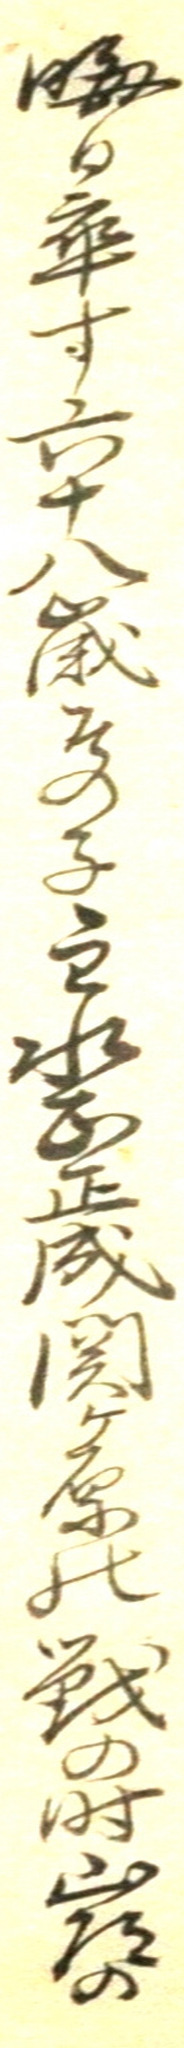晦日卒す六十八歳その子主水正正成関ヶ原の戦の時山道の
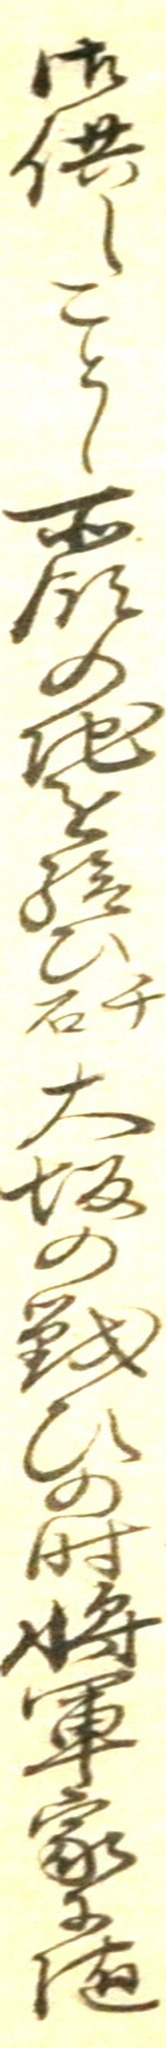御供しことし所領の地を給ひ千石大坂の戦ひの時将軍家に随
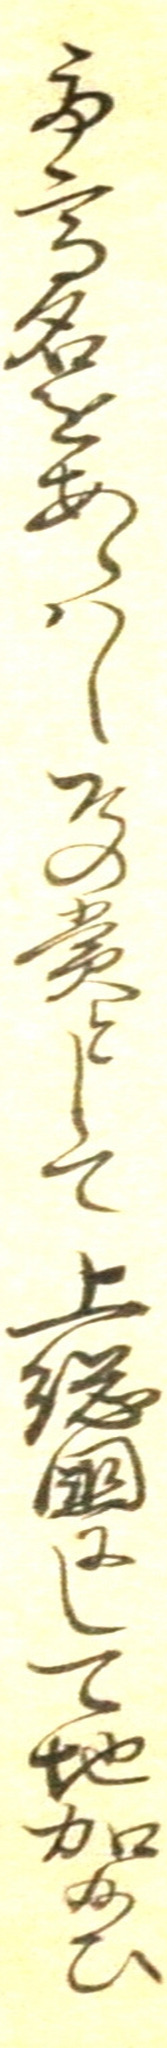て高名をあらはしその賞として上総国にして地加給ひ
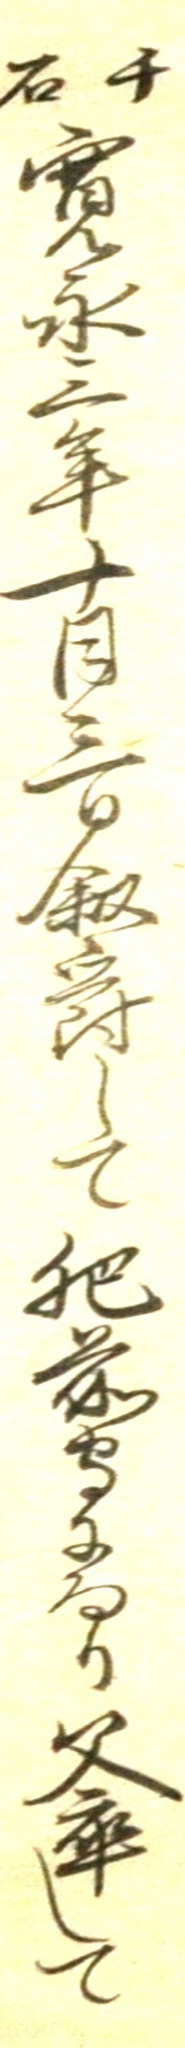千石寛永三年十月三日叙爵して肥前守になり父卒して
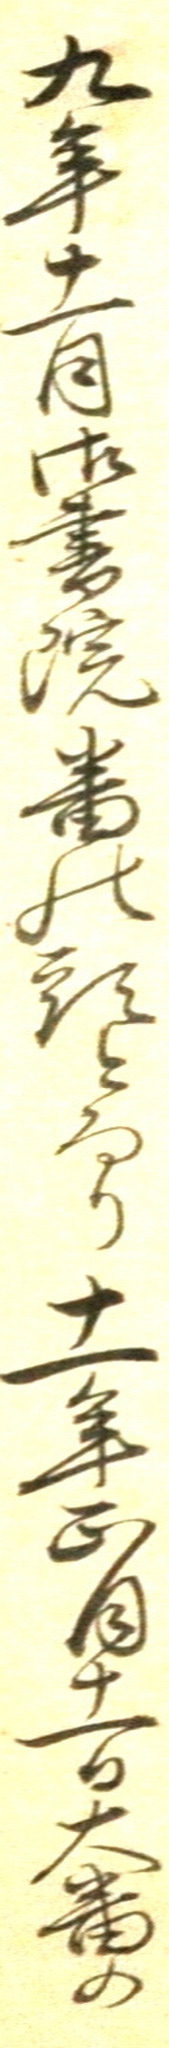九年十一月御書院番の頭となり十一年正月十一日大番の
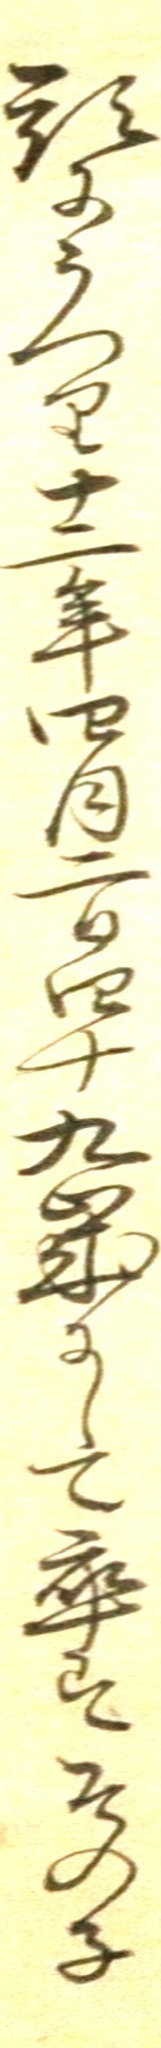頭にうつり十二年四月二日四十九歳にして卒すその子
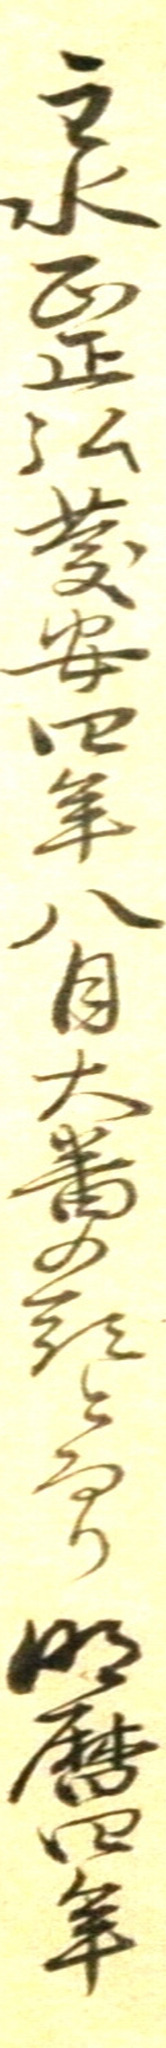主水正正弘慶安四年八月大番の頭となり明暦四年
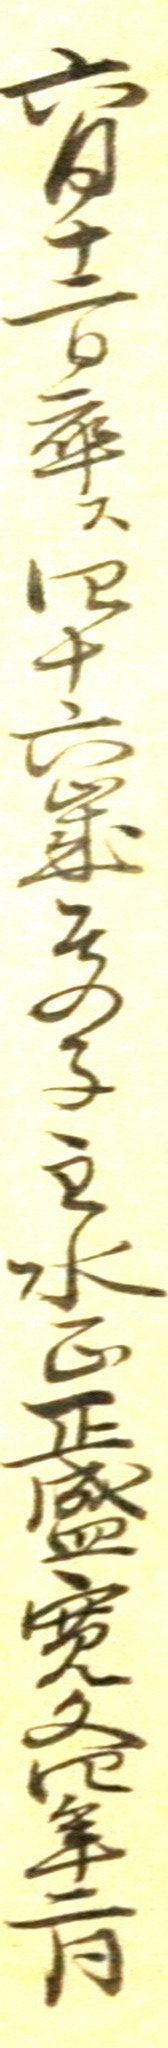六月十二日卒ス四十六歳その子主水正正盛寛文四年二月

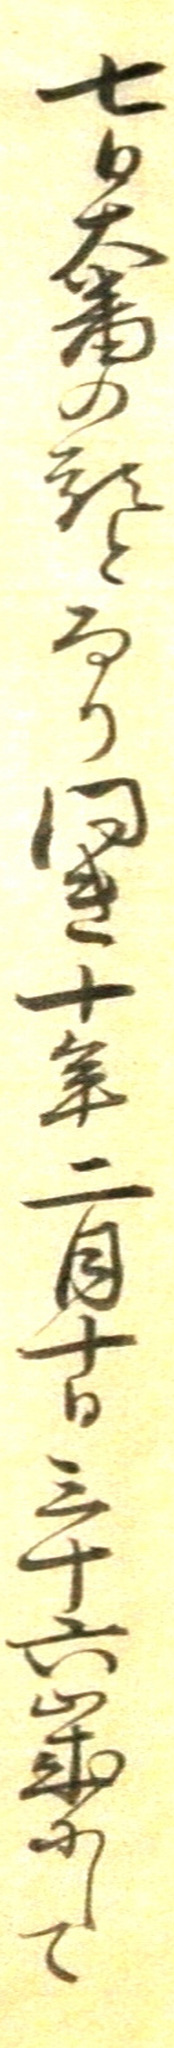七日大番の頭となり同き十年二月十日三十六歳にして
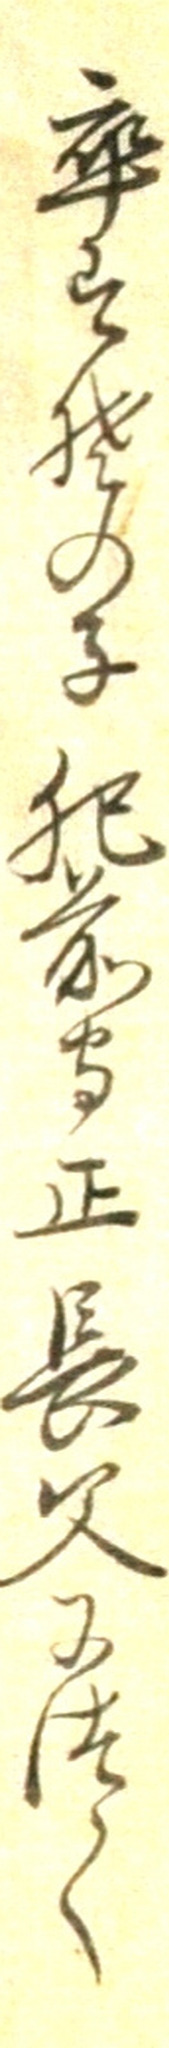卒すその子肥前守正長父につく
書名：藩翰譜（四・下）
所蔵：伊那市立高遠町図書館・合同会社AMANE
